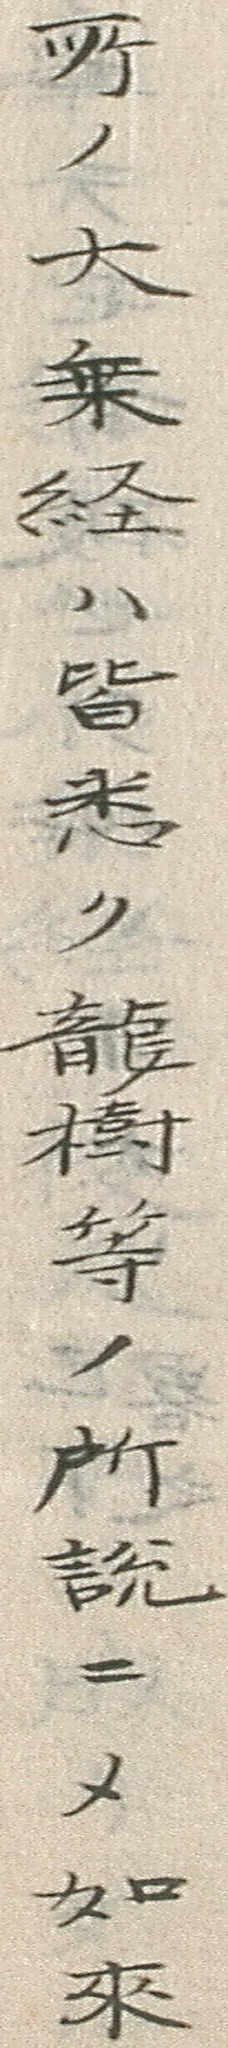所ノ大乗経ハ皆悉ク龍樹等ノ所説ニシテ如来
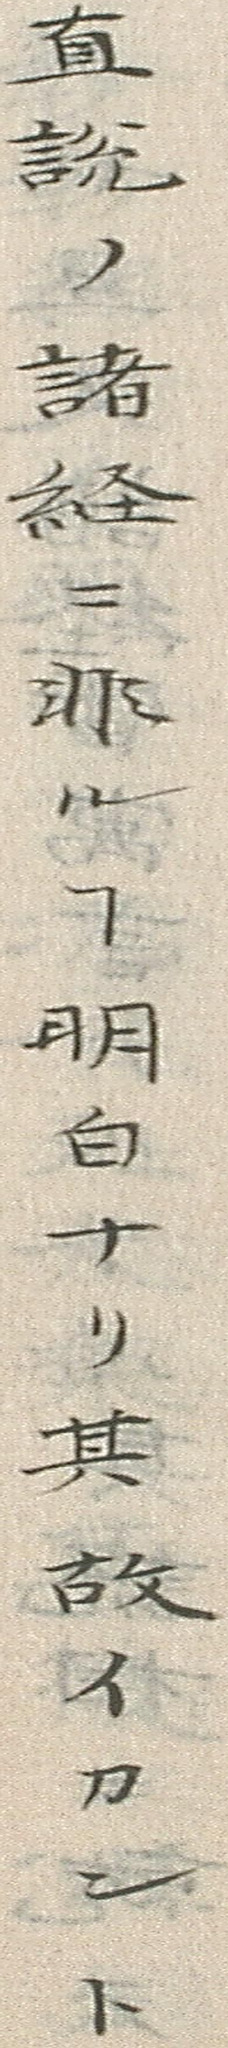真説ノ諸経ニ非ルコト明白ナリ其故イカント
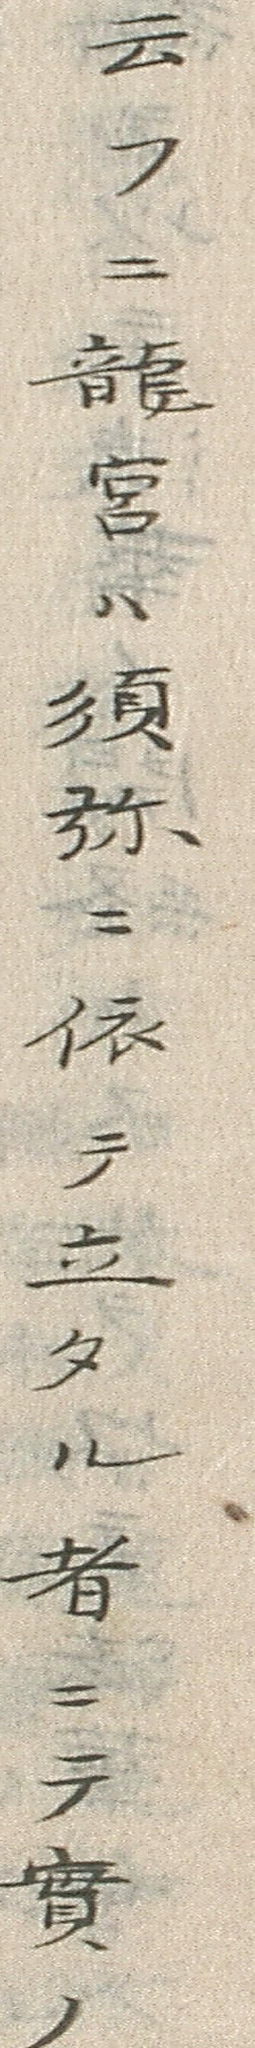云フニ龍宮ハ須弥ニ依テ立タル者ニテ実ノ
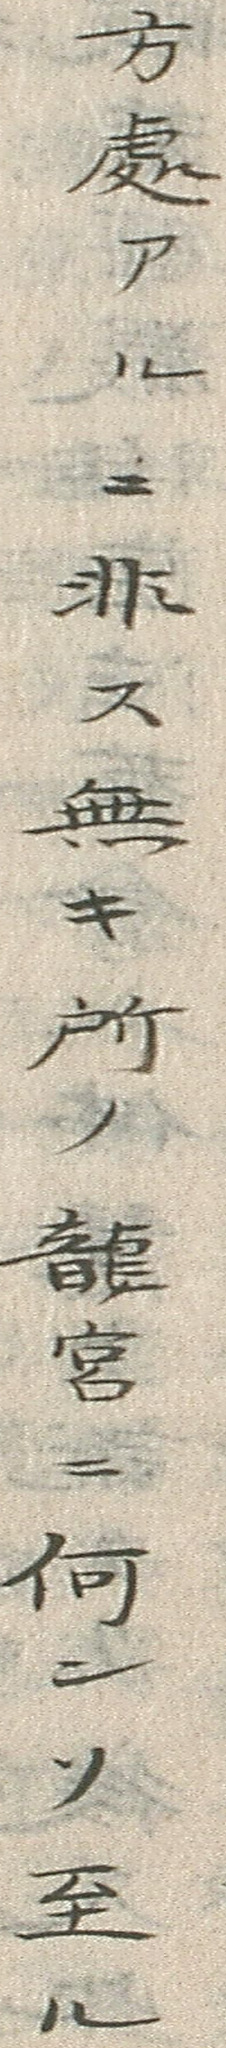方処アルニ非ス無キ所ノ龍宮ニ何ンソ至ル
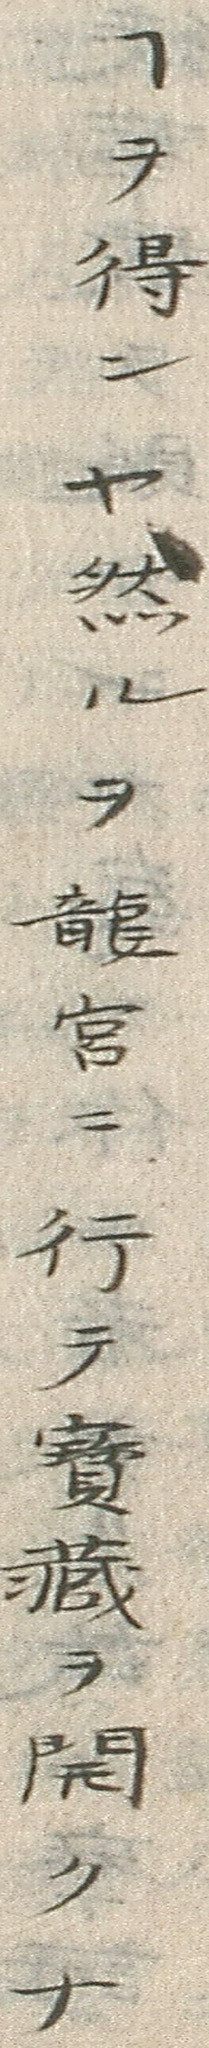コトヲ得ンヤ然ルヲ龍宮ニ行テ宝蔵ヲ開クナ
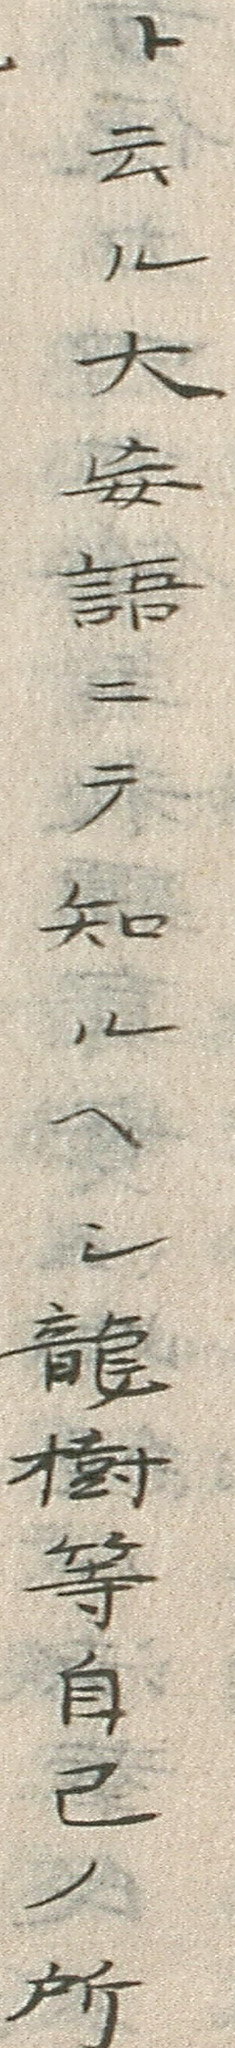ト云ル大妄語ニテ知ルヘシ龍樹等自己ノ所
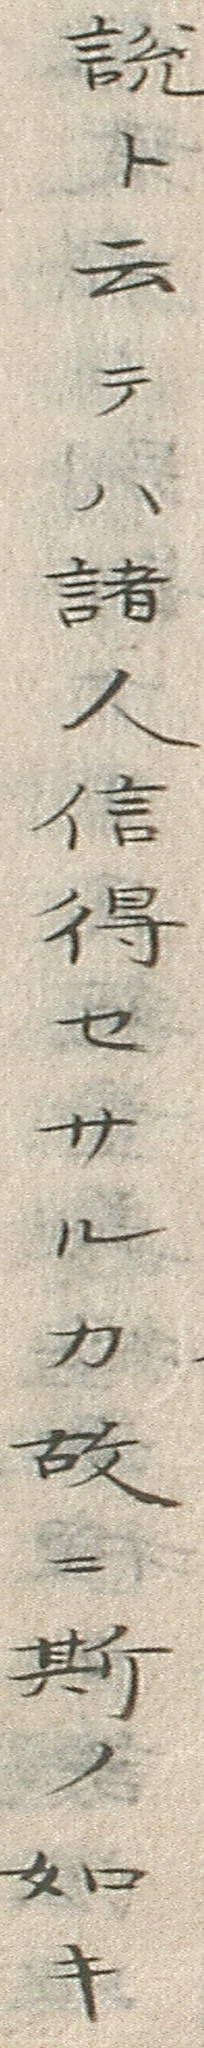説ト云テハ諸人信得セサルカ故ニ斯ノ如キ
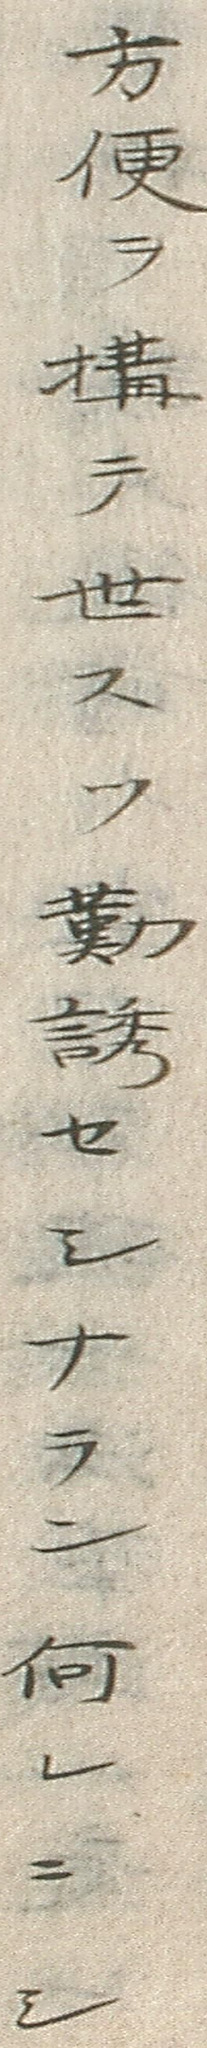方便ヲ構テ世スツ勤誘セシナラン何レニシ
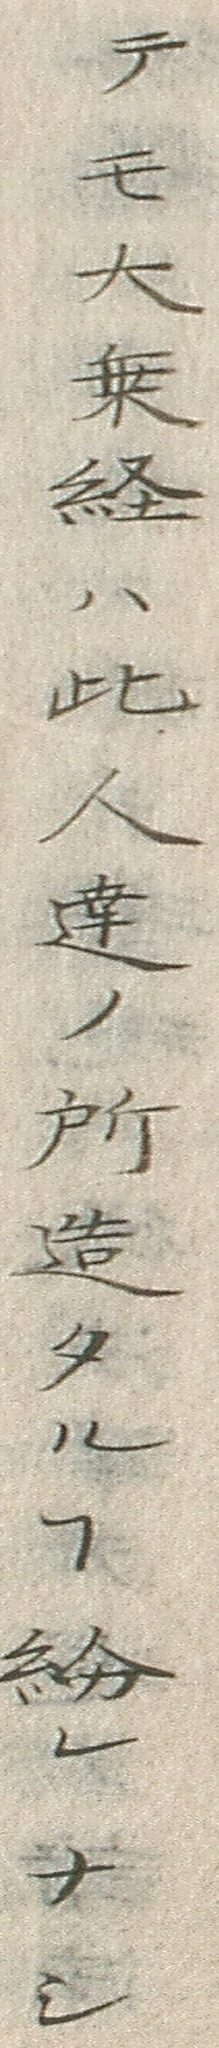テモ大乗経ハ此人達ノ所造タルコト紛レナシ
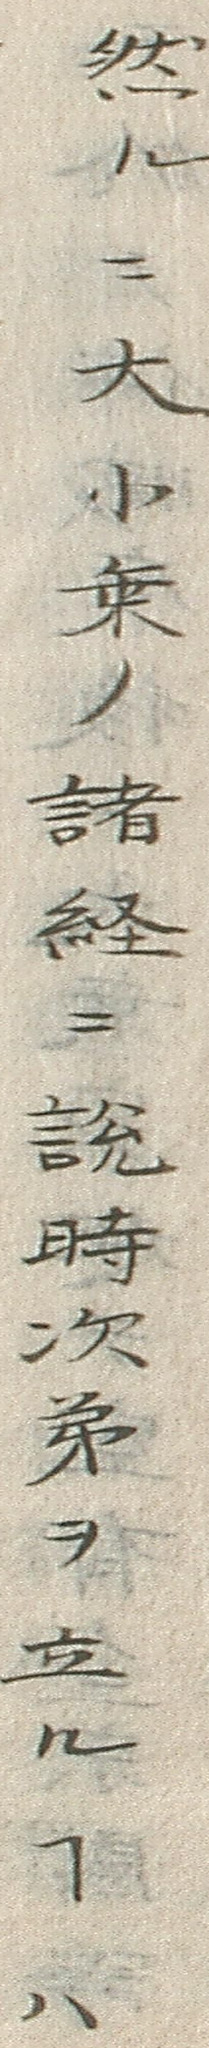然ルニ大小乗ノ諸経ニ説時次第ヲ立ルコトハ
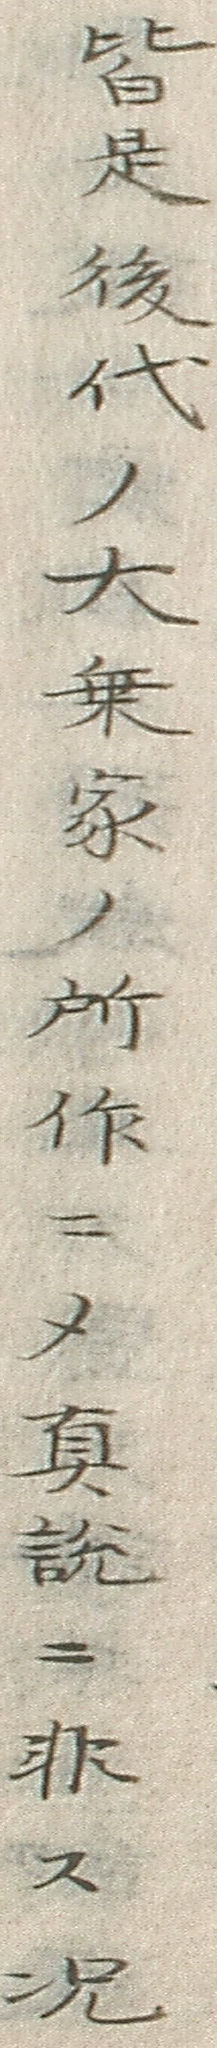皆是後代ノ大乗家ノ所作ニシテ真説ニ非ス況
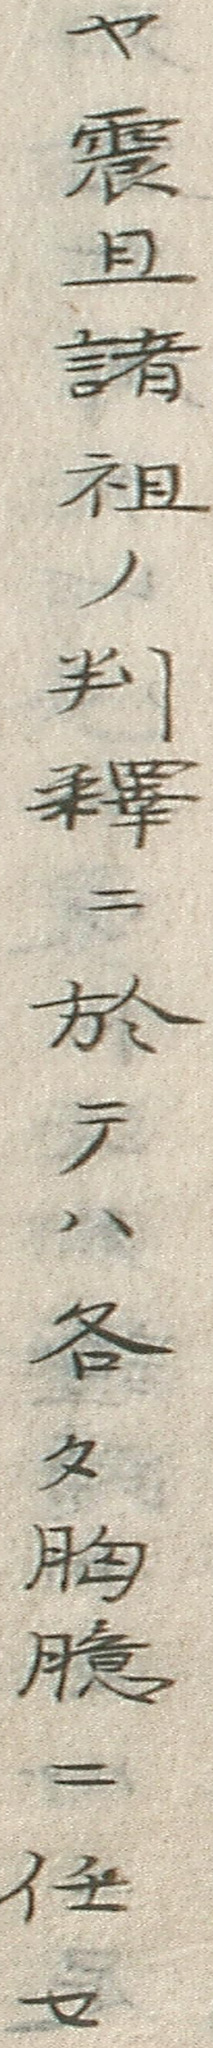ヤ震旦諸祖ノ判釈ニ於テハ各タ胸臆ニ任セ

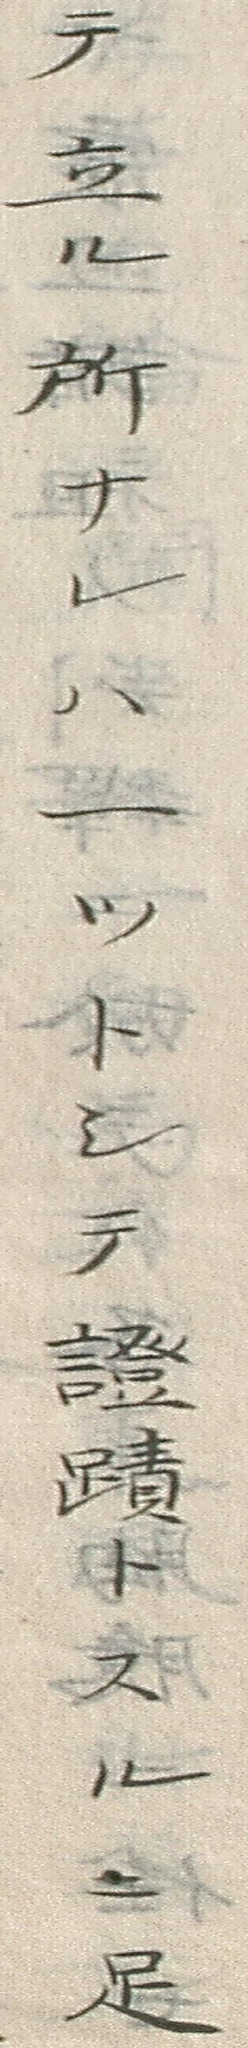テ立ル所ナレハ一ツトシテ証蹟トスルニ足
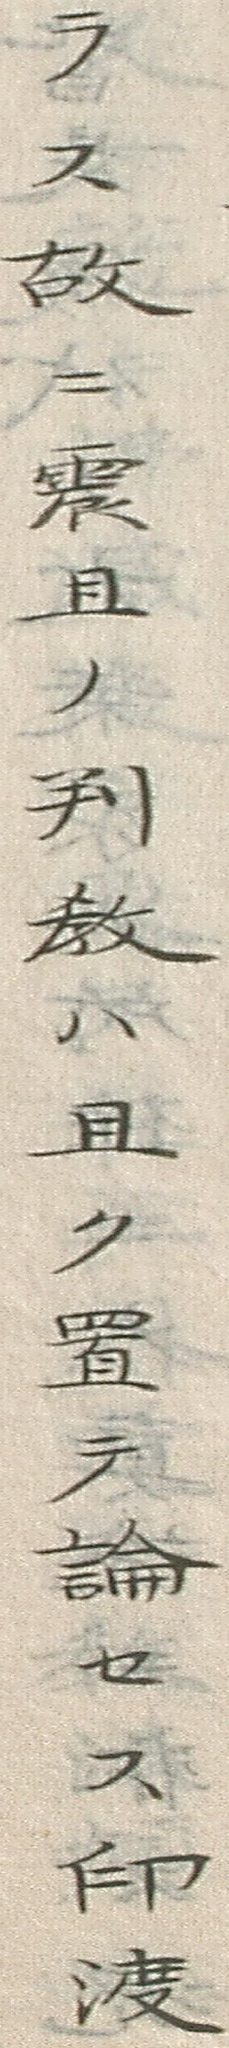ラス故ニ震旦ノ判教ハ且ク置テ論セス印渡
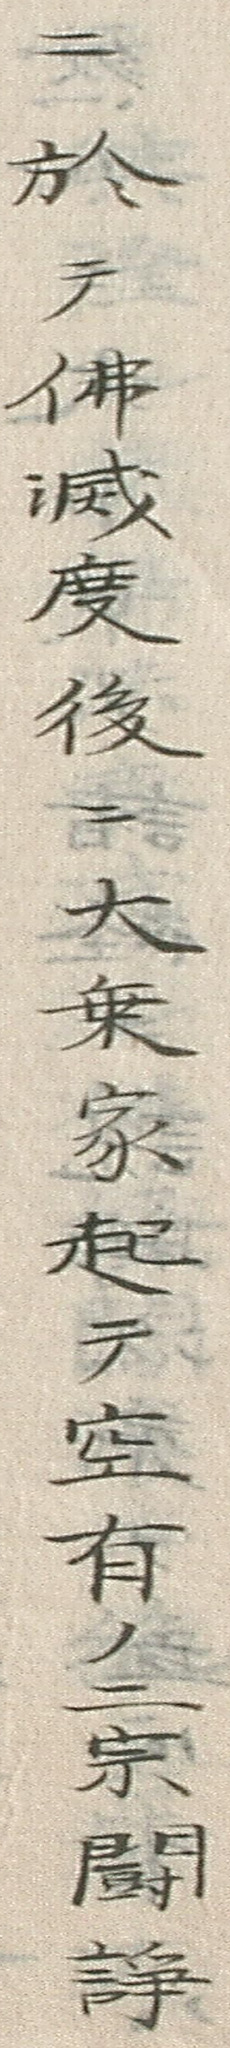ニ於テ仏滅度後ニ大乗家起テ空有ノ二宗闘争
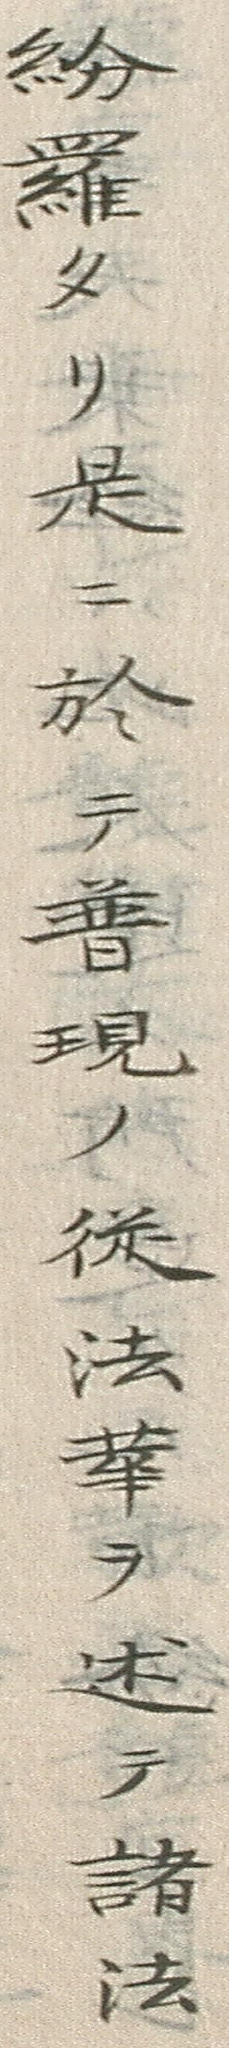紛羅タリ是ニ於テ普現ノ従法華ヲ述テ諸法
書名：天學略名目羽翼　全
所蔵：東京大学地震研究所図書室 Earthquake Research Institute Library, The University of Tokyo, JAPAN
